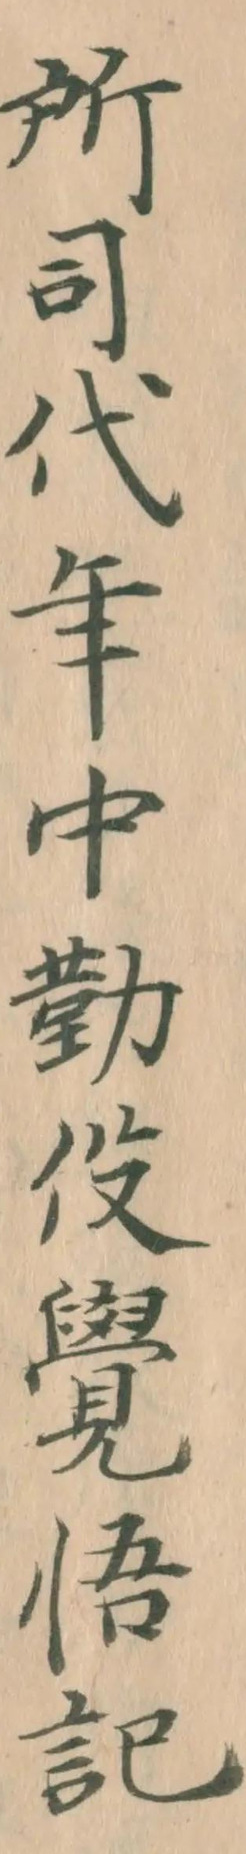所司代年中勤役覚悟記

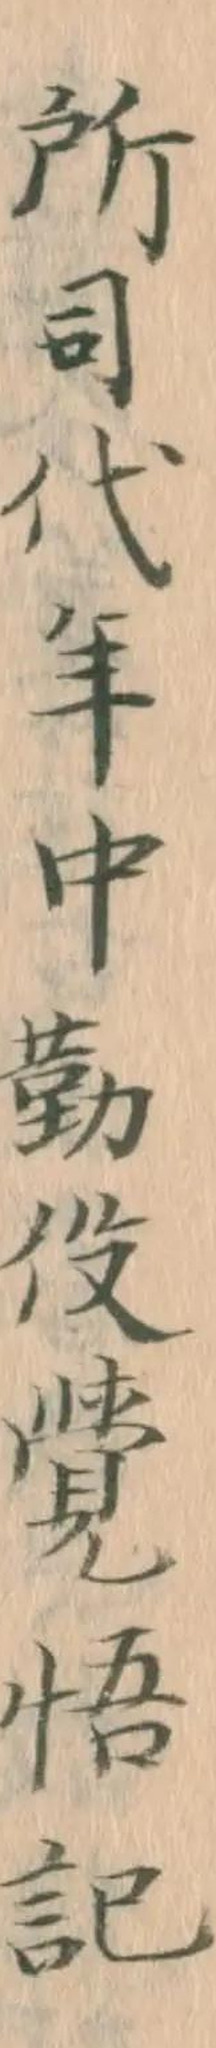所司代年中勤役覚悟記
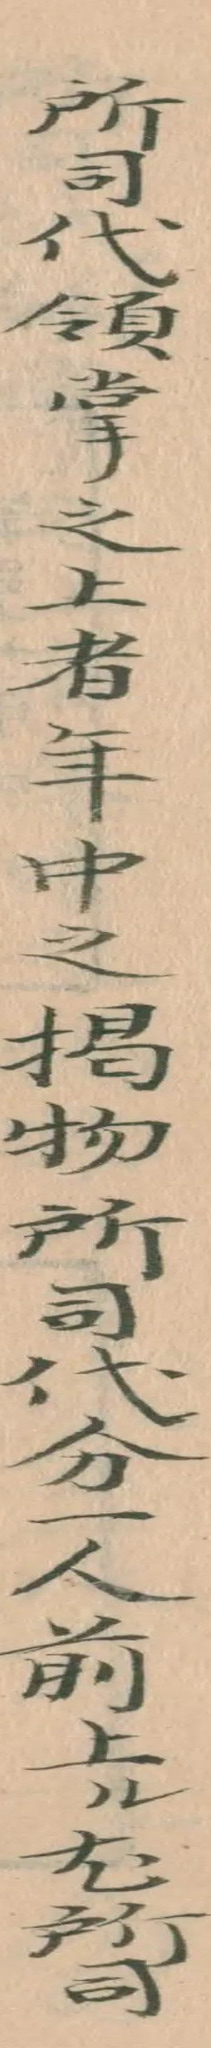一所司代領掌之上者年中之掲物所司代分一人前上ル尤所司
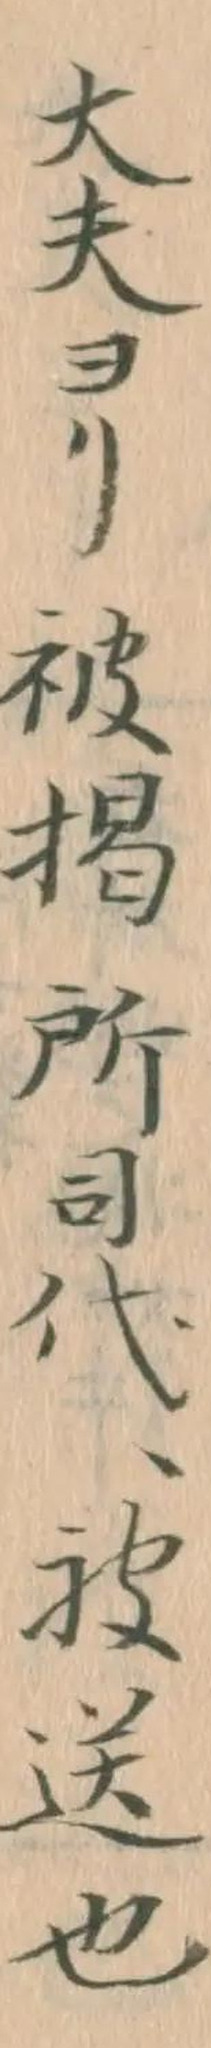大夫より被掲所司代ヘ被送也
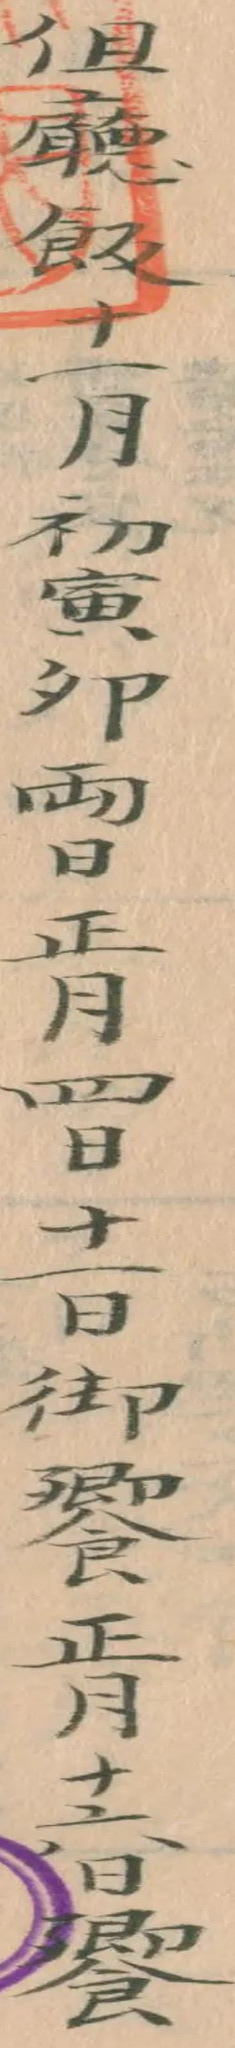但廳飯十一月初寅卯両日正月四日十一日御饗正月十六日饗
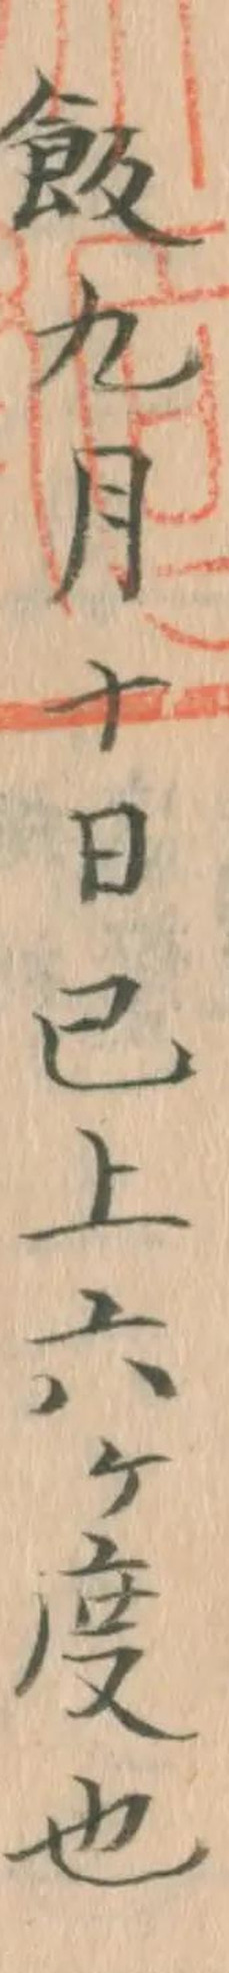飯九月十日已上六ケ度也
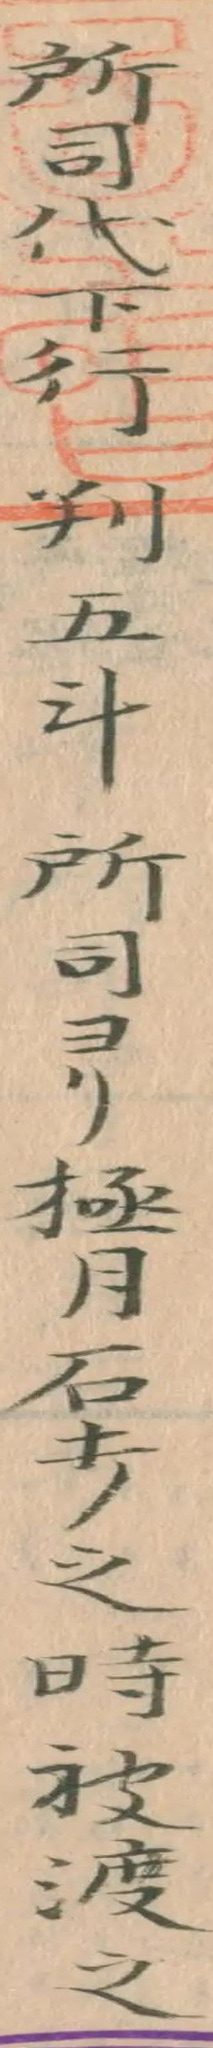所司代下行判五斗所司ヨリ極月石打之時被渡之
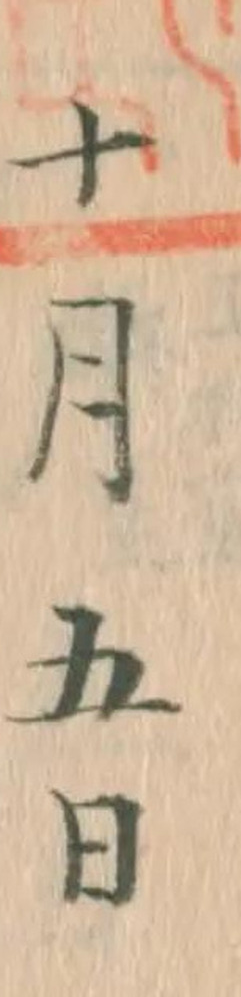十月五日
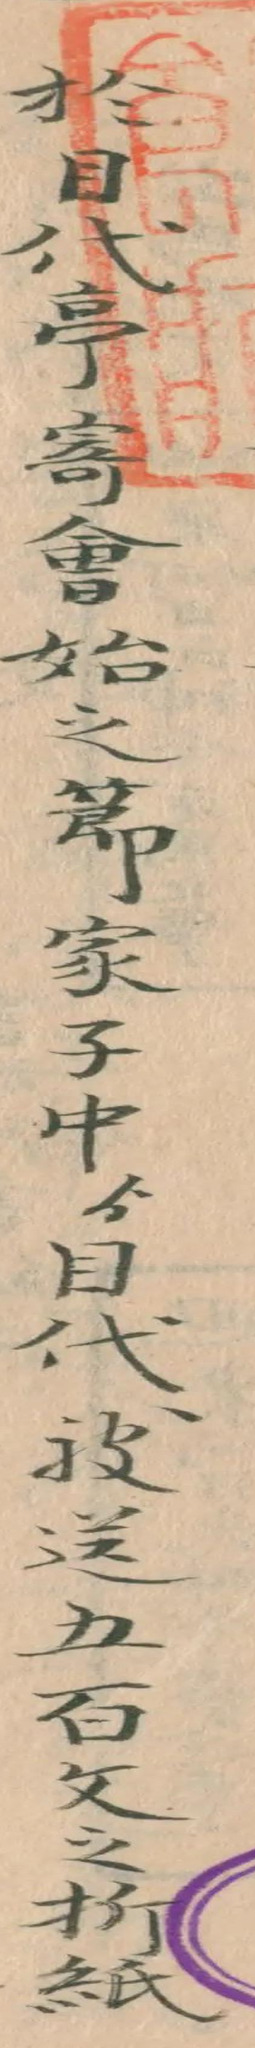一於目代亭寄會始之節家子中ゟ目代ヘ被送五百文之折紙
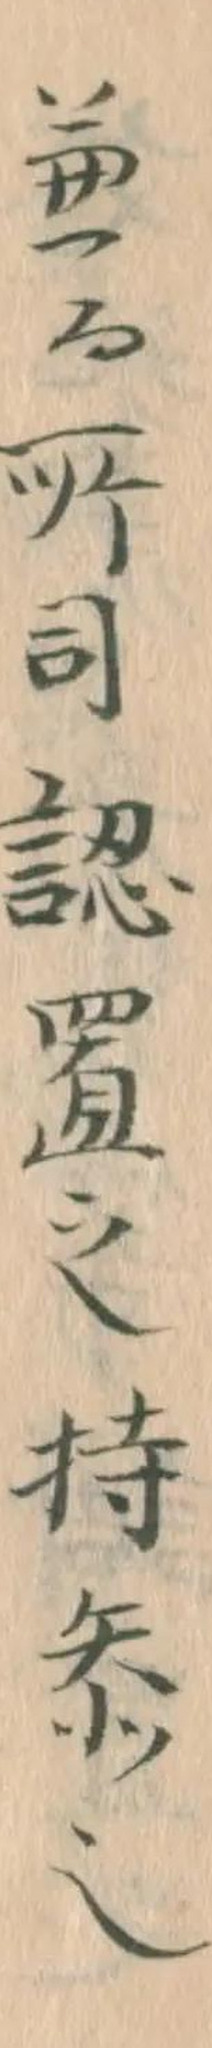兼而所司認置之持参也
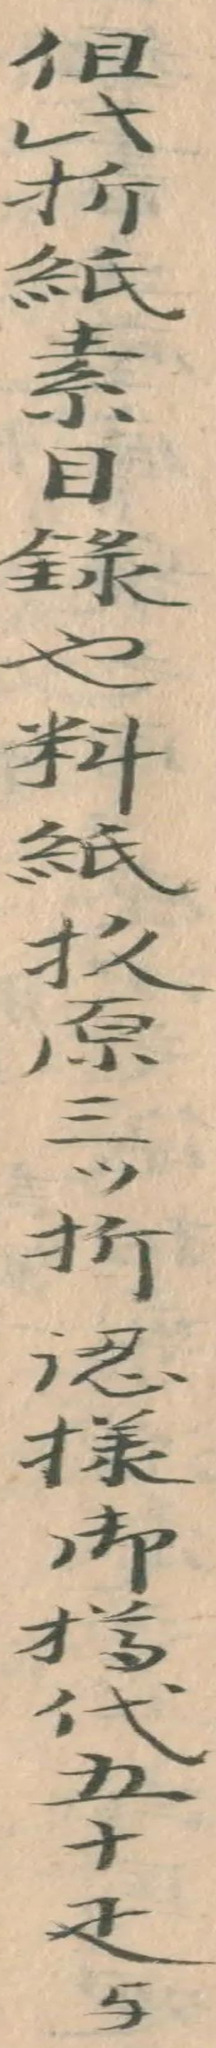但此折紙素目録也料紙杦原三ツ折認様御樽代五十疋と
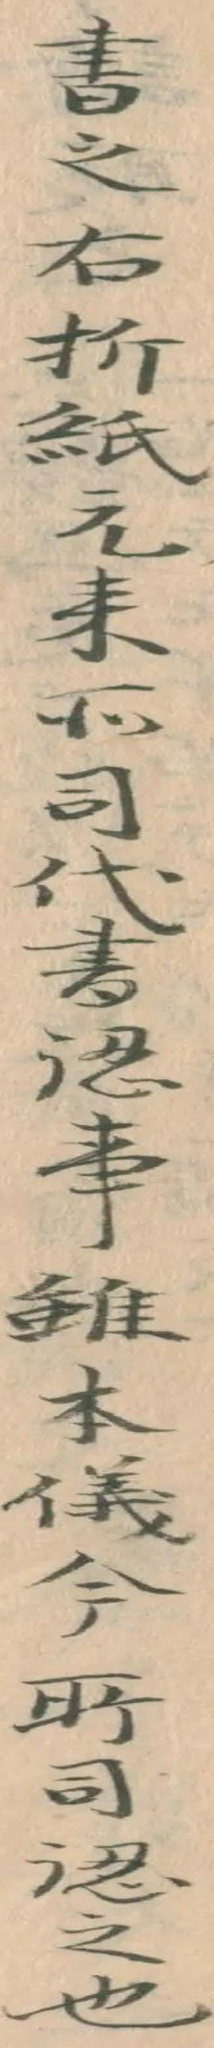書之右折紙元来所司代書認事雖本儀今所司認之也

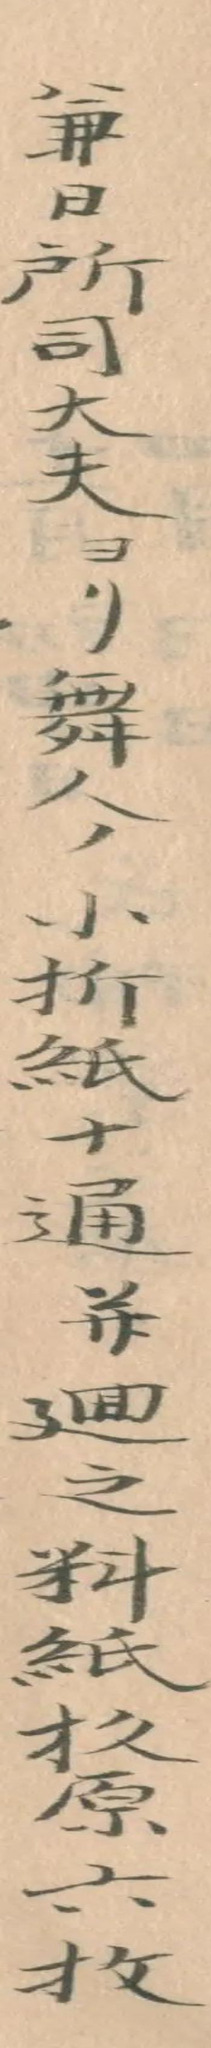一兼日所司大夫ヨリ舞人ノ小折紙十通并廻之料紙杦原六枚
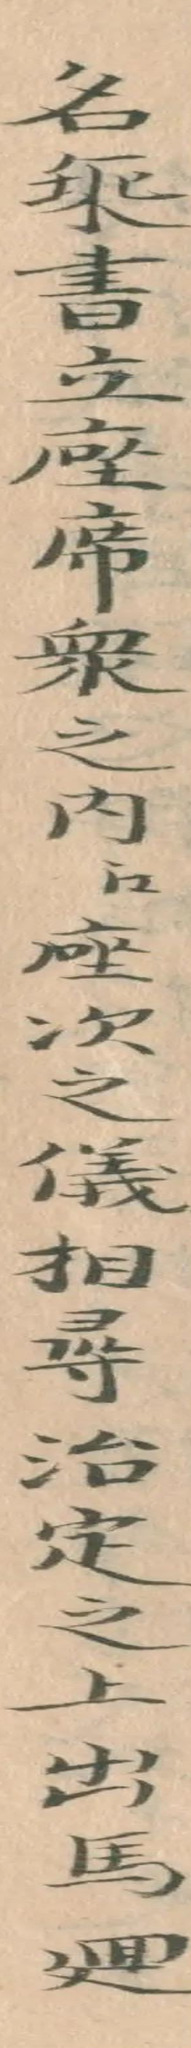名乗書立座席衆之内え座次之儀相尋治定之上出馬廻
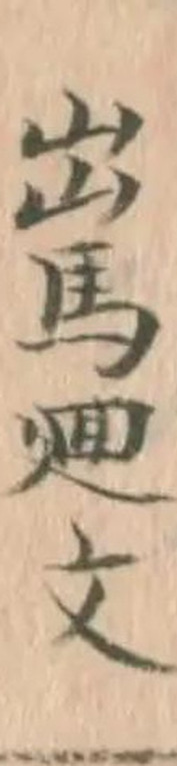出馬廻文
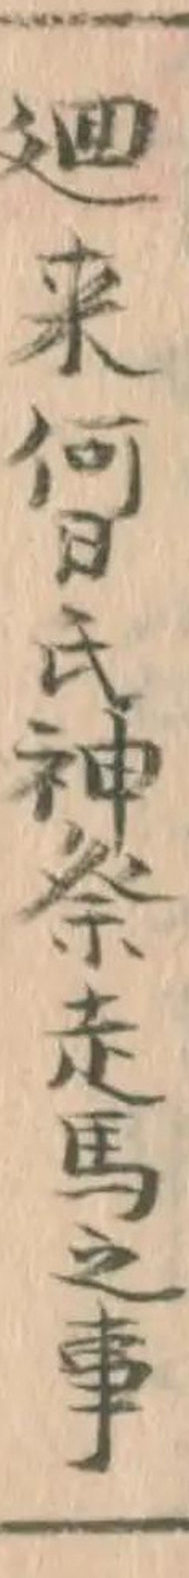廻来何日氏神祭走馬之事
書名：賀茂社記録. 第40冊
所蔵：国立国会図書館 National Diet Library, JAPAN
